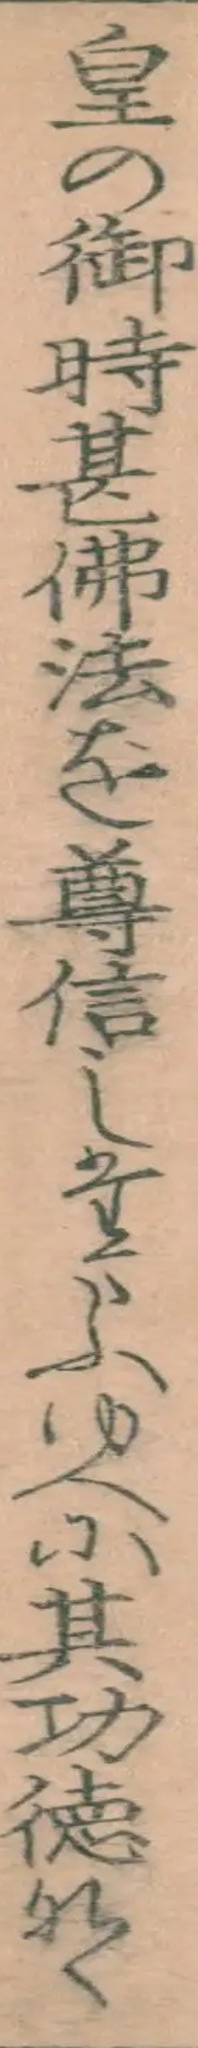皇の御時甚仏法を尊信したるゆへに其功徳なく
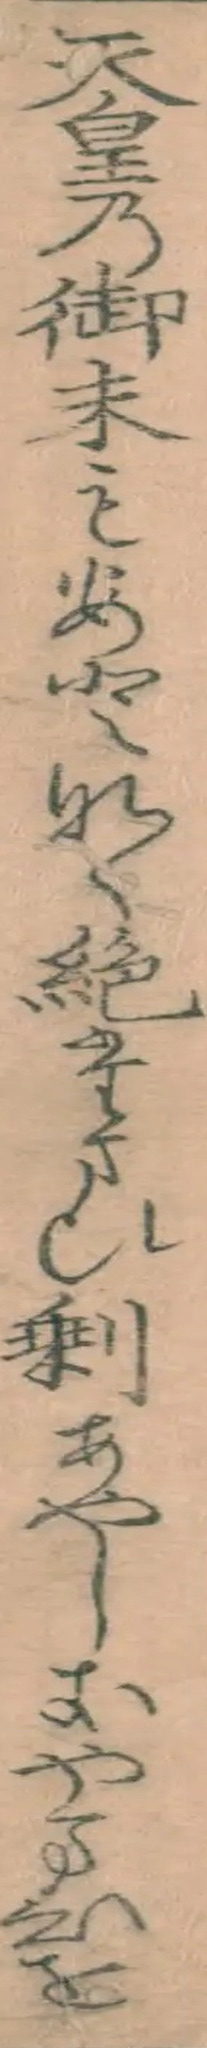天皇の御末もめとなく絶たまひ剰あやしきやまひを

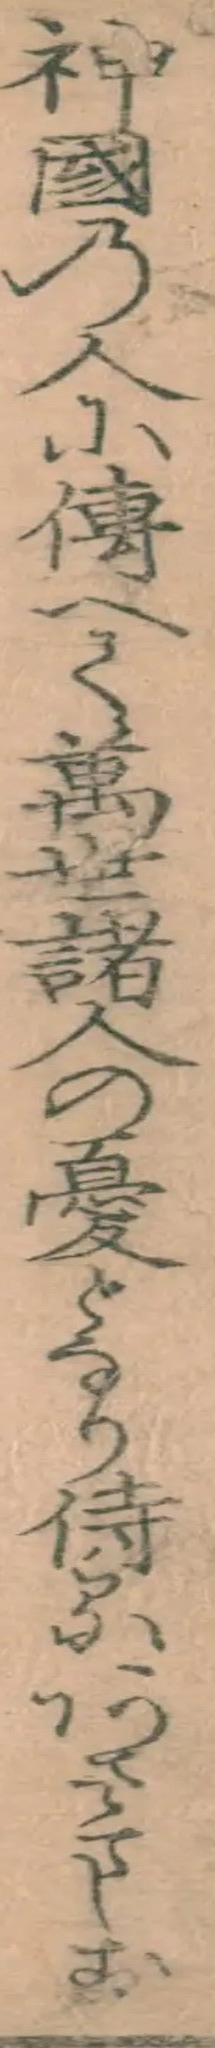神国の人に伝へて万世諸人の憂となり侍るあさましき
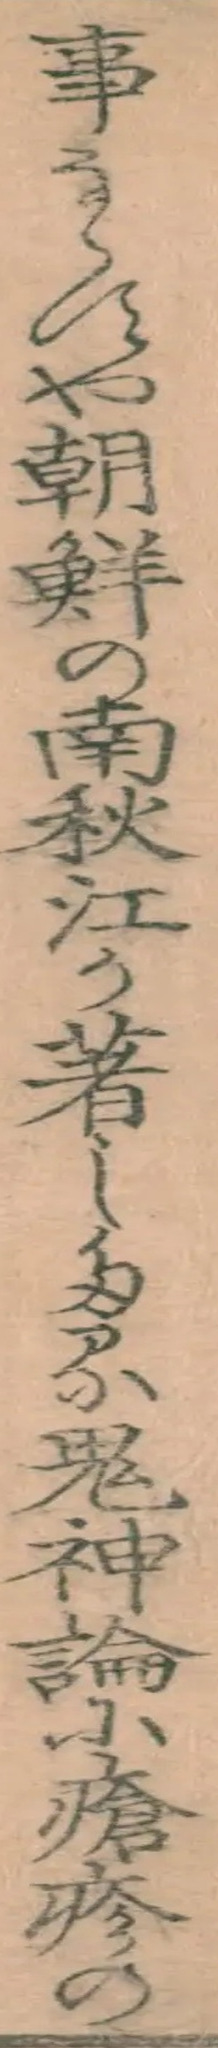事ならすや朝鮮の南秋江か著したる鬼神論に瘡疹の
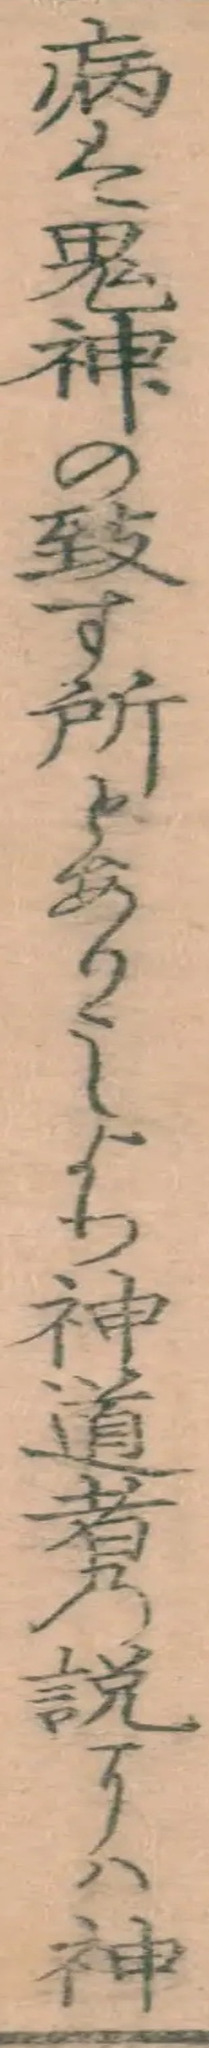病は鬼神の致す所とありしより神道者の説には神
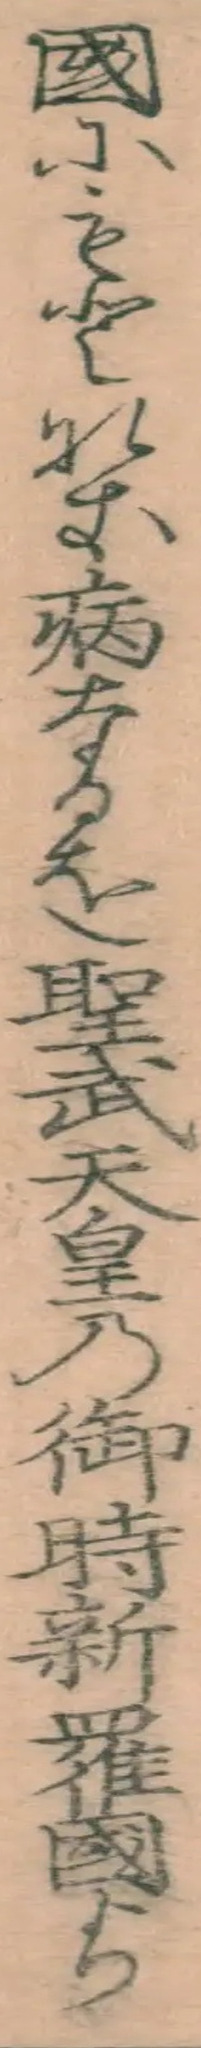国にもとなき病なるを聖武天皇の御時新羅国より
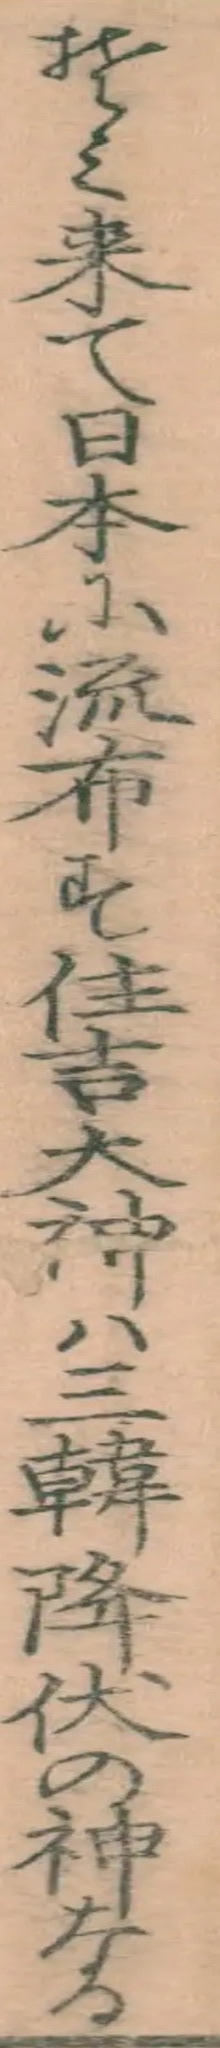そみ来て日本に流布す住吉大神は三韓降伏の神なる
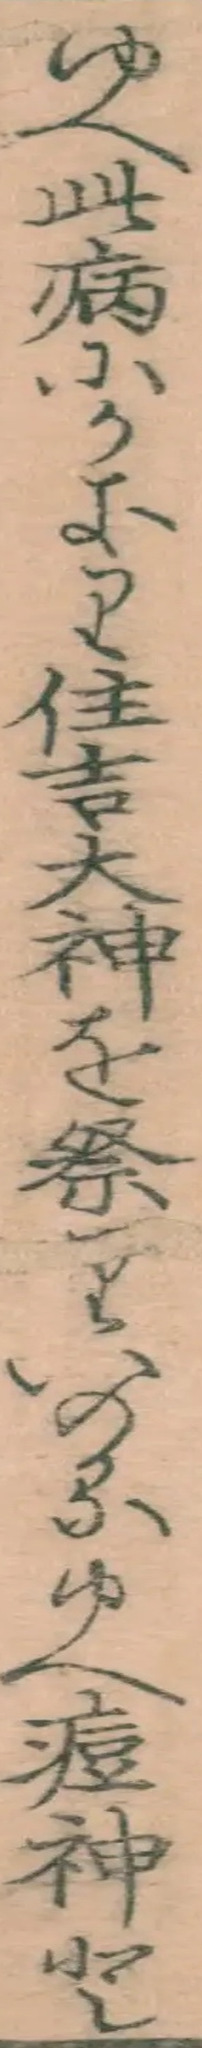ゆへ此病にかきり住吉大神を祭りいのるゆへ痘神と
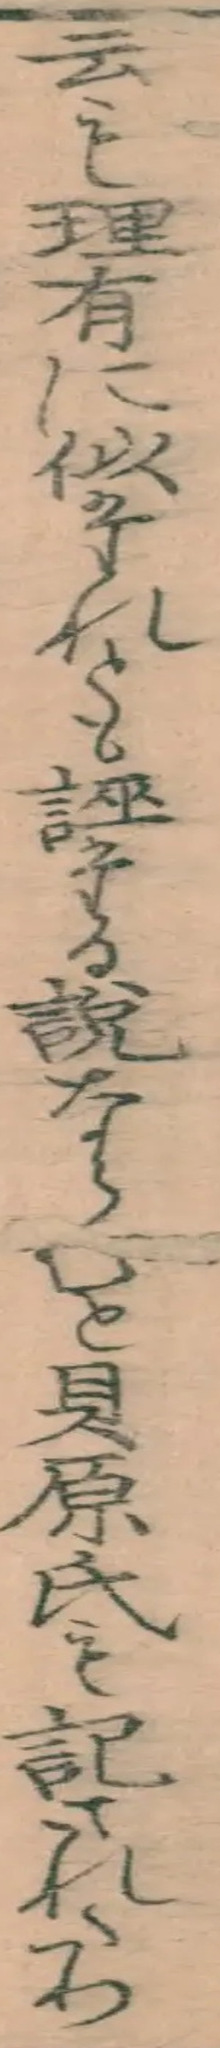云も理有に似たれとも誣たる説ならむと貝原氏も記されたり
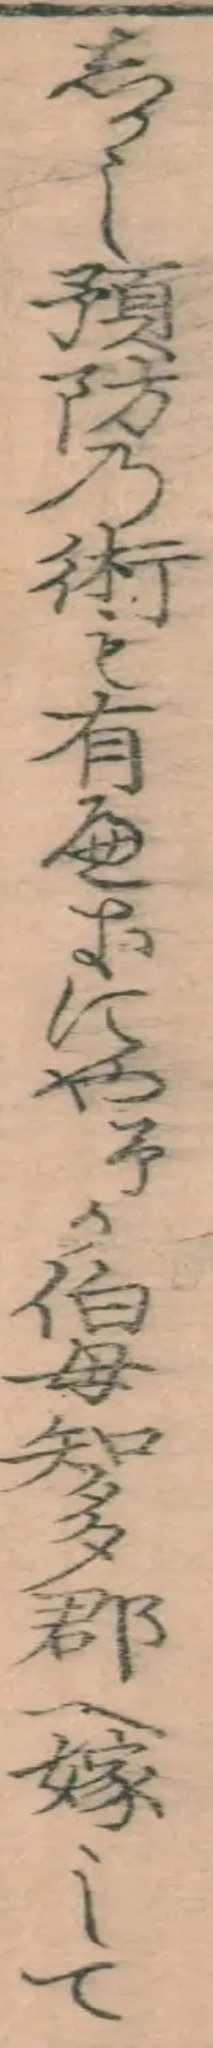しかし預防の術も有へきにや予か伯母知多郡へ嫁して
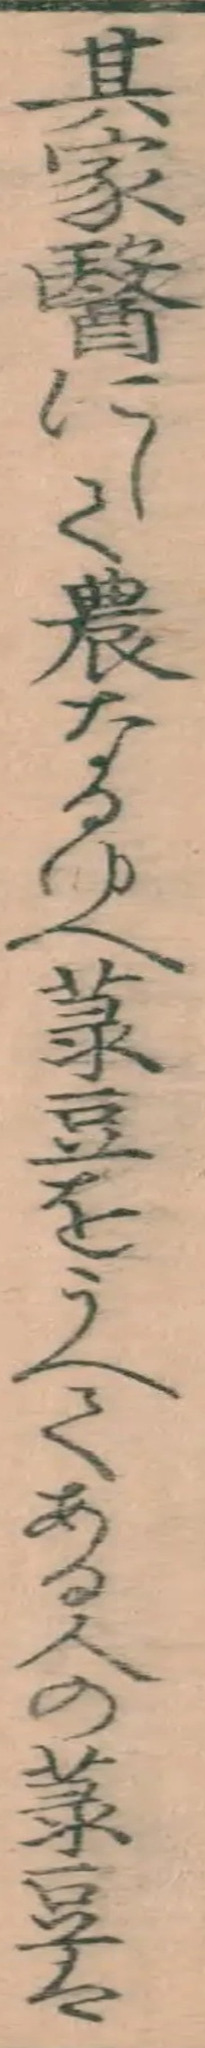其家医にして農なるゆへ菉豆をうへてある人の菉豆は
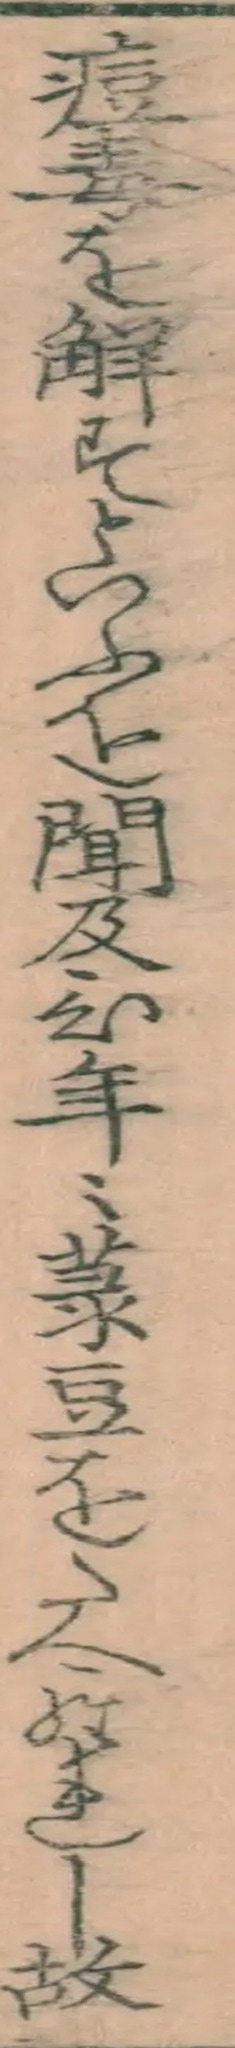痘毒を解すといふを聞及ひ年々菉豆をたへられし故
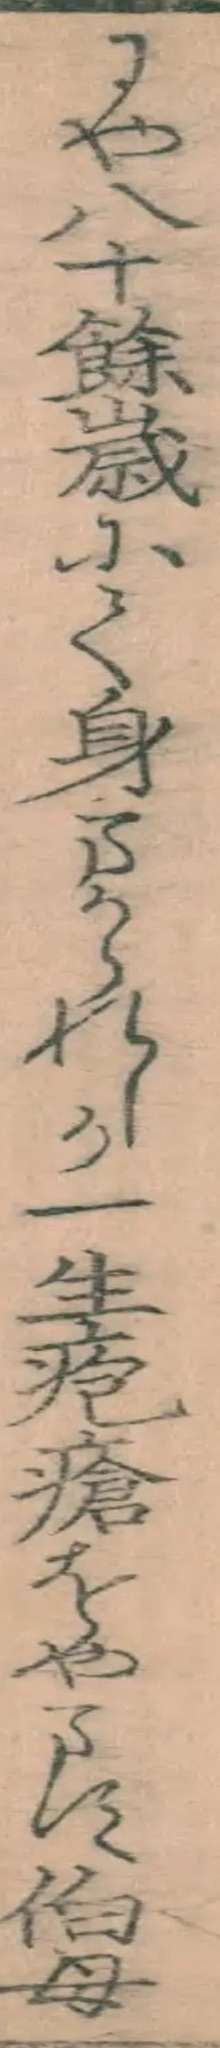にや八十余歳にて身まかられしか一生疱瘡をやます伯母
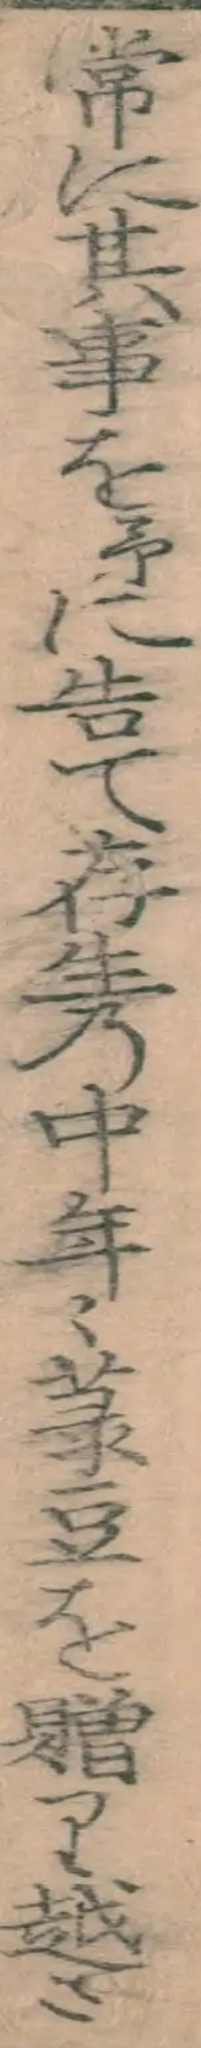常に其事を予に告て存生の中年々菉豆を贈り越さ

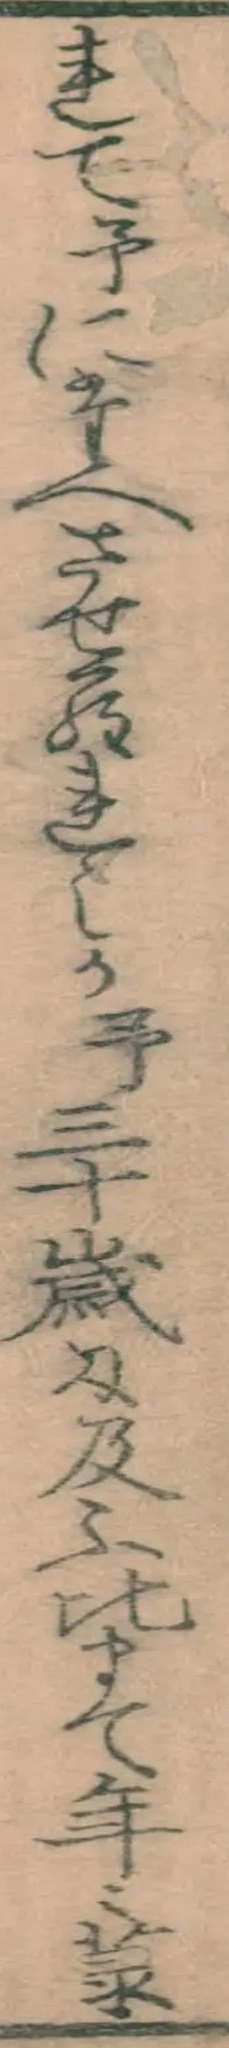れて予にたへさせられしか予三十歳に及ふ此まて年々菉
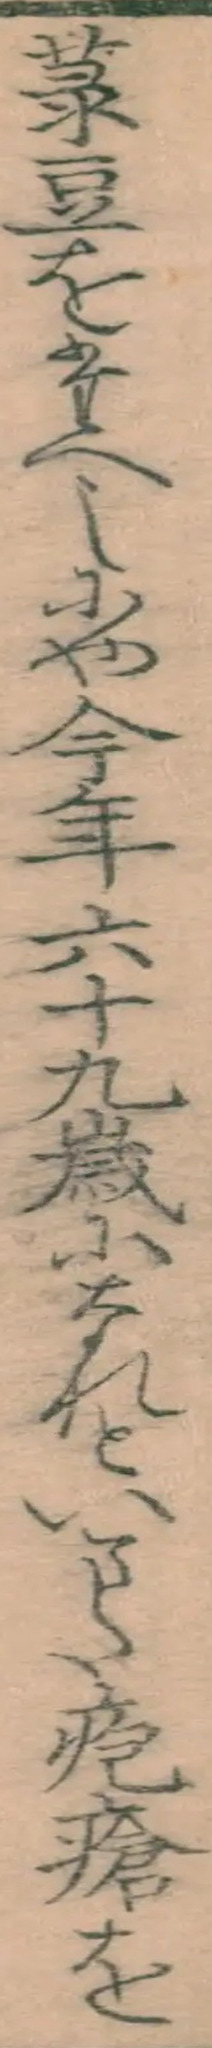菉豆をたへしにや今年六十九歳になれといまた疱瘡を
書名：雨夜談
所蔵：国立国会図書館 National Diet Library, JAPAN
